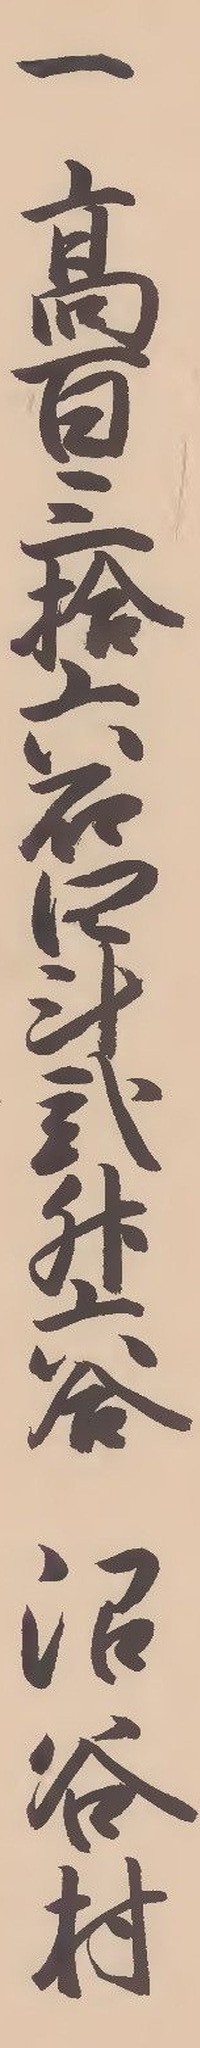一高百三拾六石四斗弐升六合沼谷村

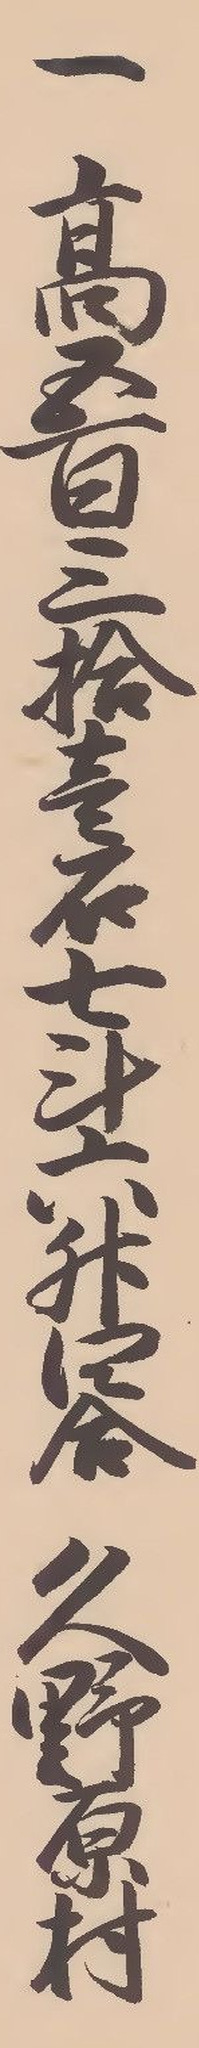一高五百三拾壱石七斗六升四合久野原村
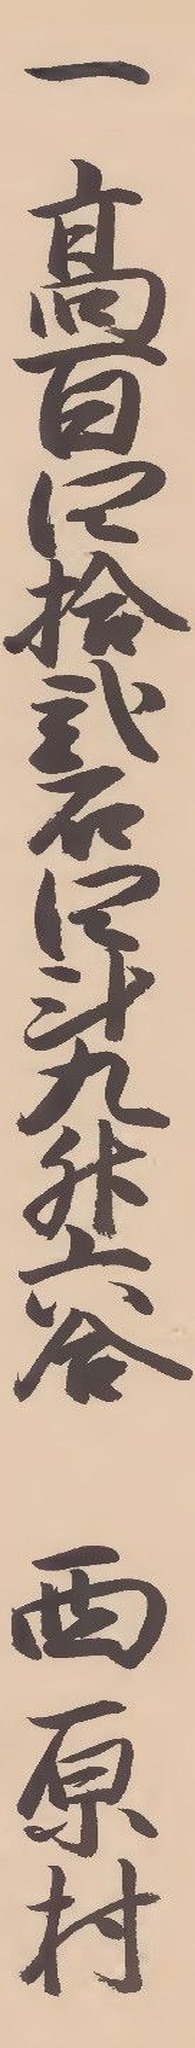一高百四拾弐石四斗九升六合西原村
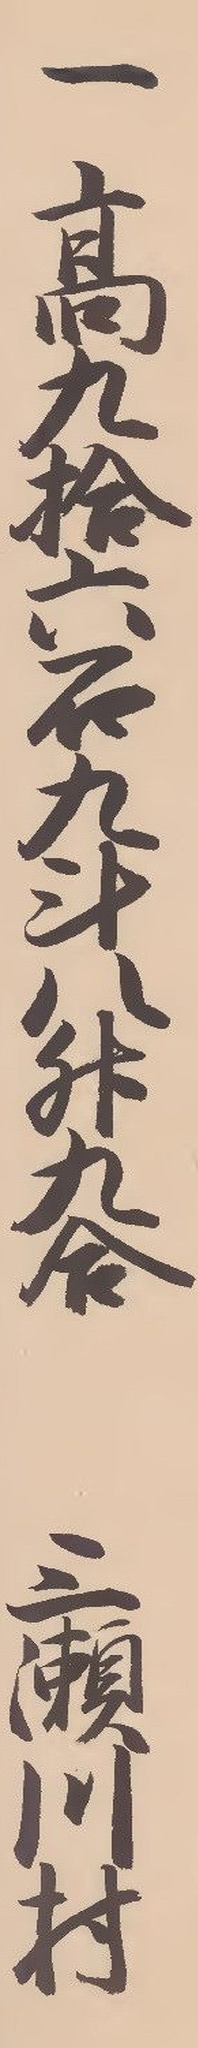一高九拾六石九斗八升九合三瀬川村
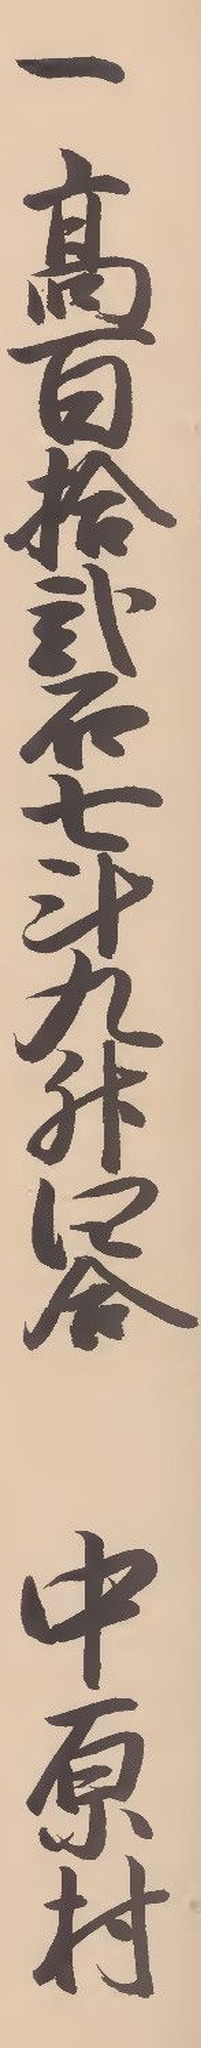一高百拾弐石七斗九升四合中原村
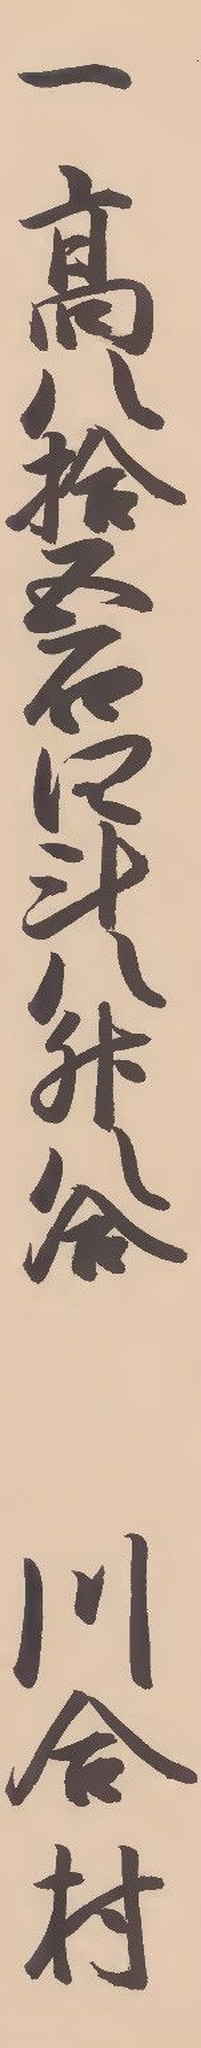一高八拾五石四斗八升八合川合村
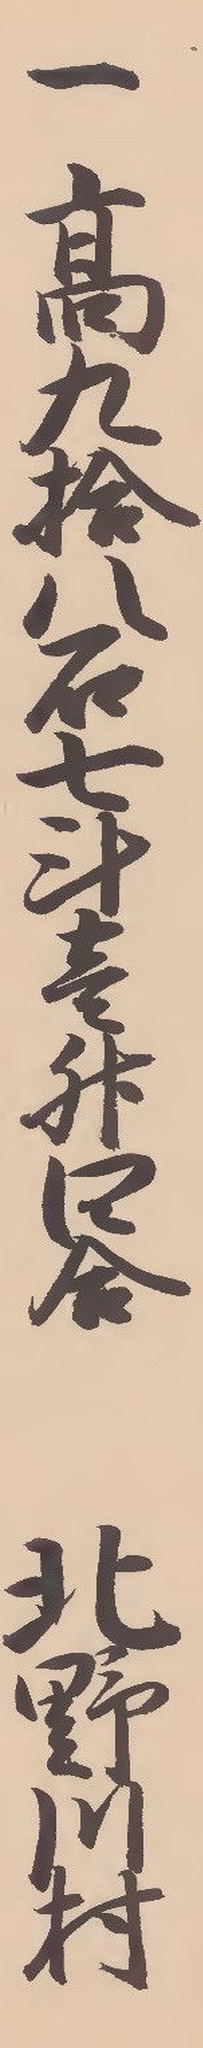一高九拾八石七斗壱升四合北野川村
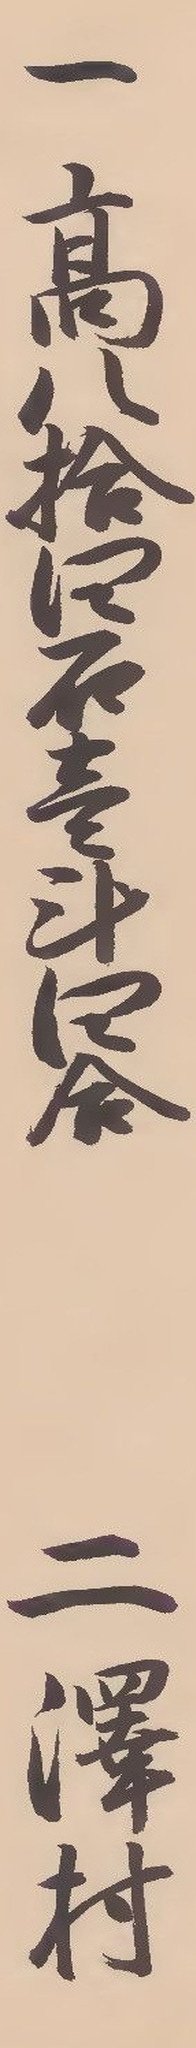一高八拾四石壱斗四合二沢村

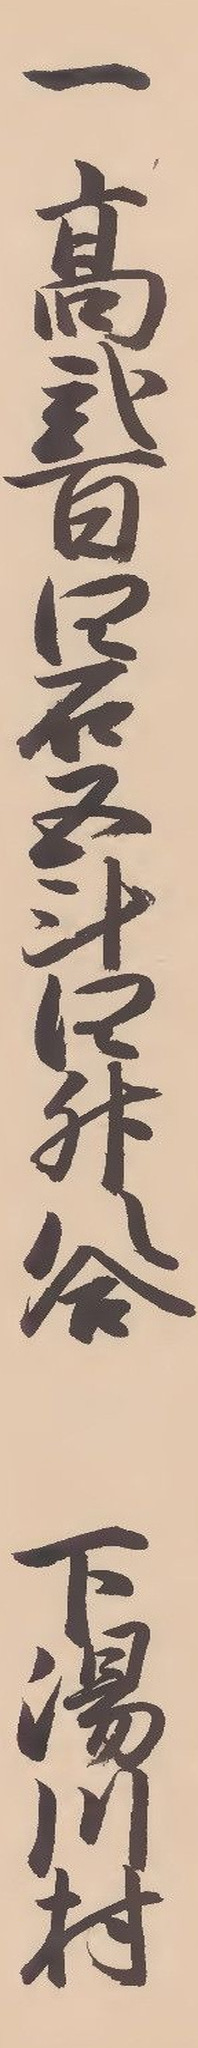一高弐百四石五斗四升八合下湯川村
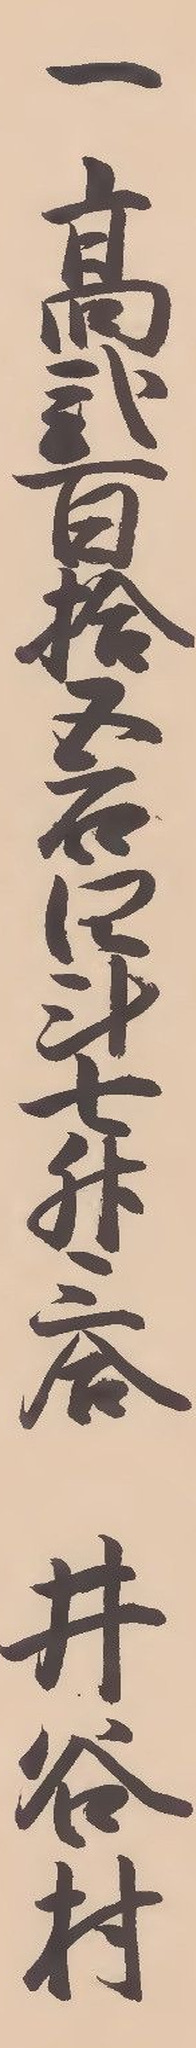一高弐百拾五石四斗七升三合井谷村
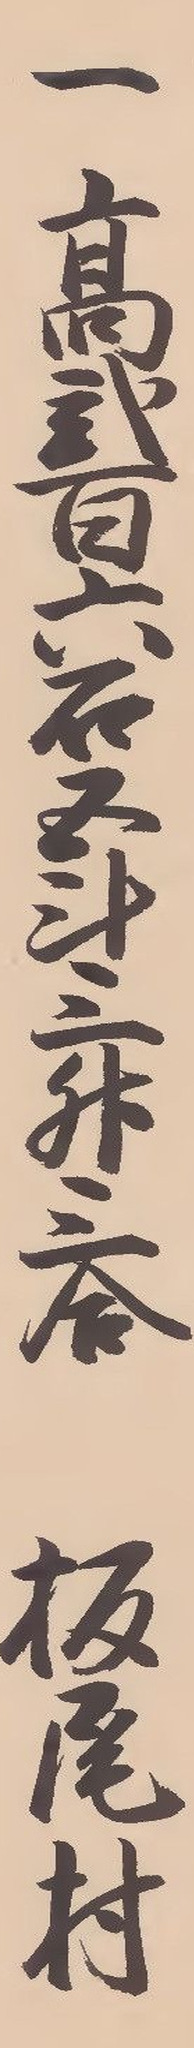一高弐百六石五斗三升三合板尾村
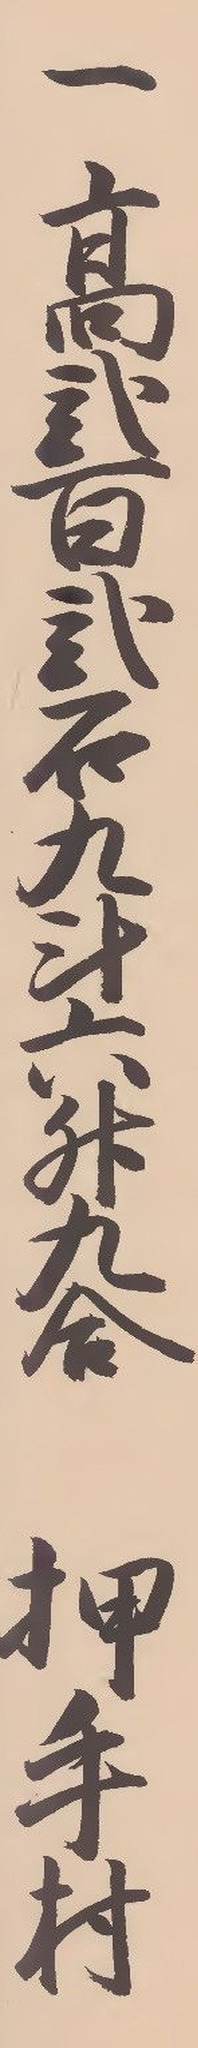一高弐百弐石九斗六升九合押手村
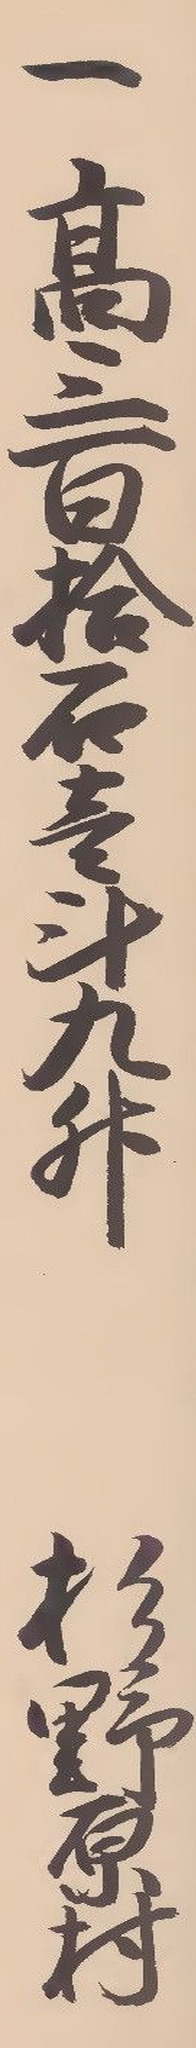一高三百拾石壱斗九升杉野原村
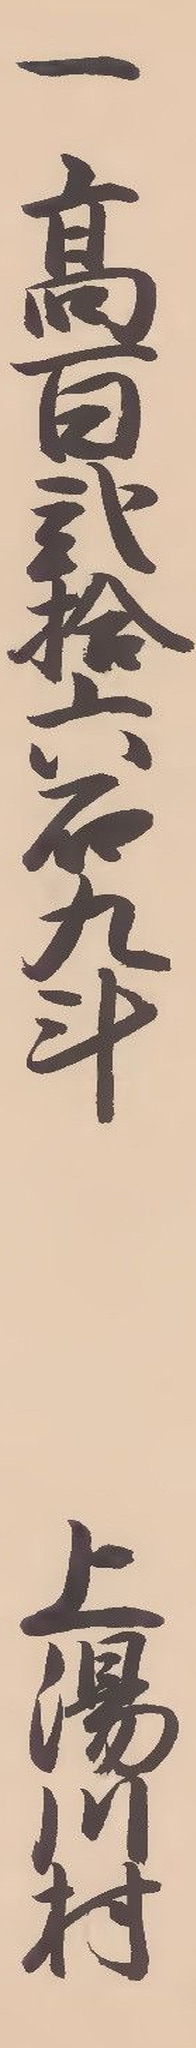一高百弐拾六石九斗上湯川村
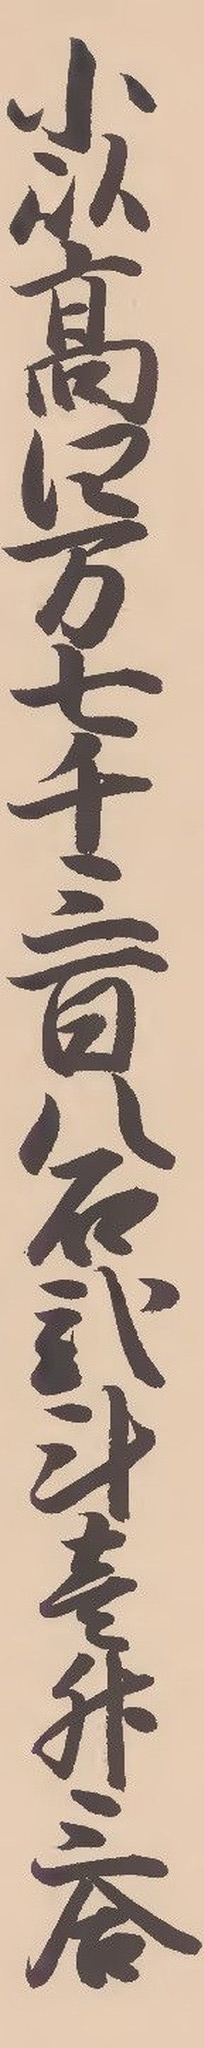小以高四万七千三百八石弐斗壱升三合

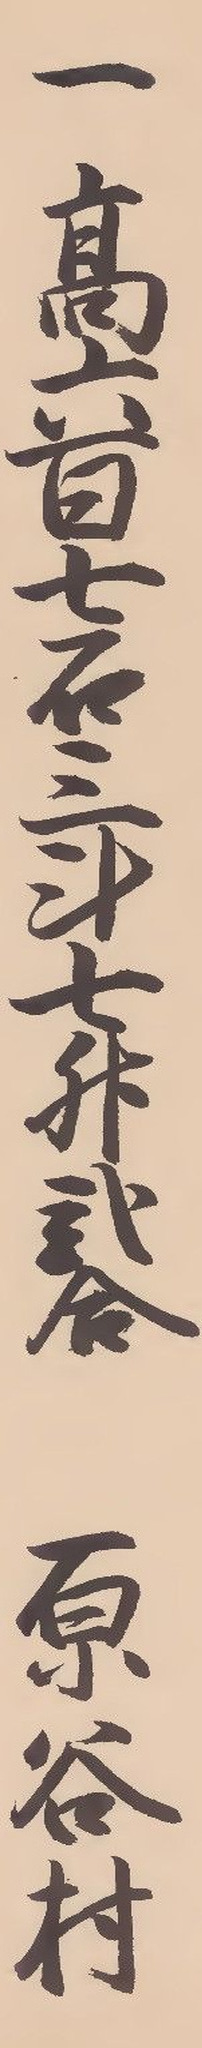一高六百七石三斗七升弐合原谷村
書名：紀伊国郷帳
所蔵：国立公文書館 National Archives of Japan
